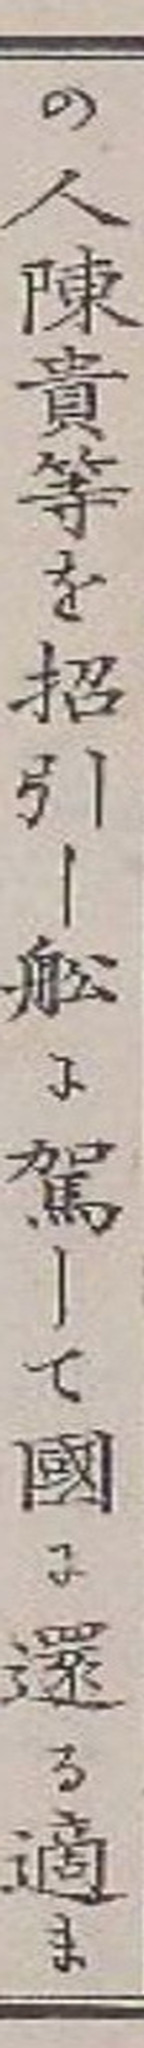の人陳貴等を招引し舩に駕して国に還る適
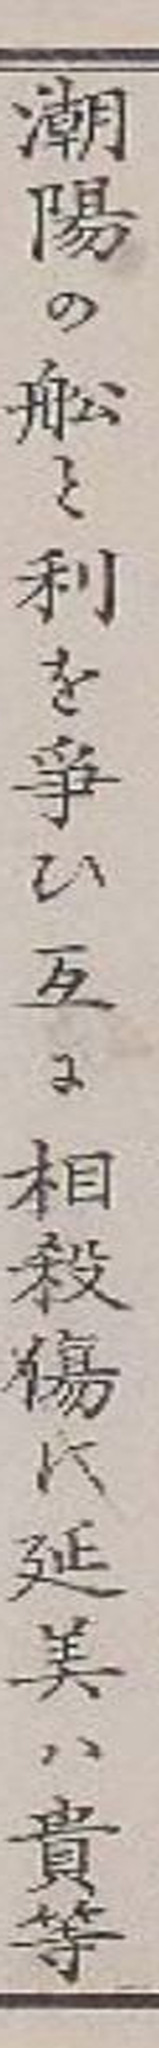潮陽の舩と利を争い互に相殺傷す延美は貴等
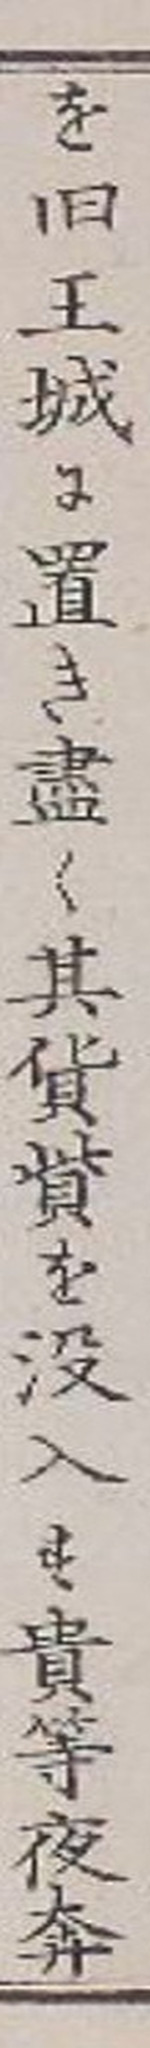を旧王城に置き尽し其貨を没入す貴等夜奔
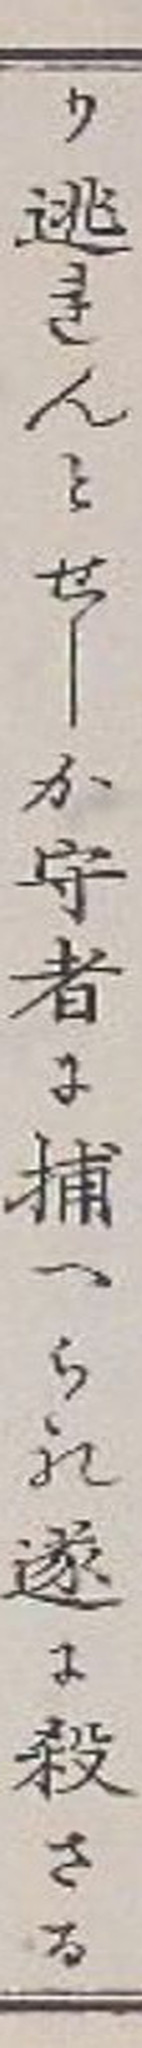り逃れんとせしか守者に捕へられ遂に殺さる
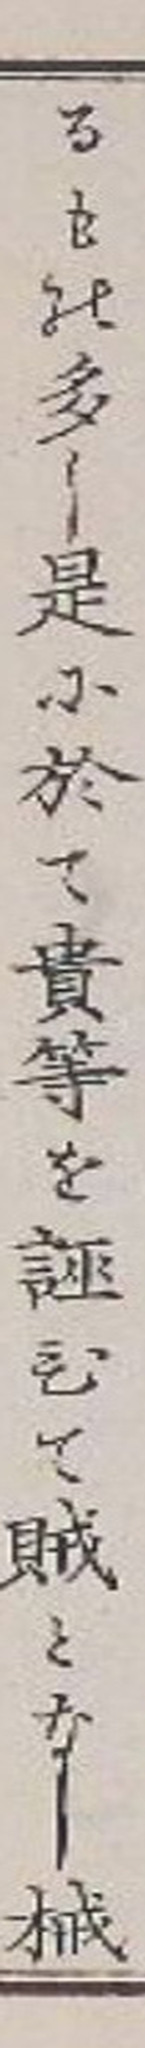るもの多し是に於て貴等を誣ひて賊となり械
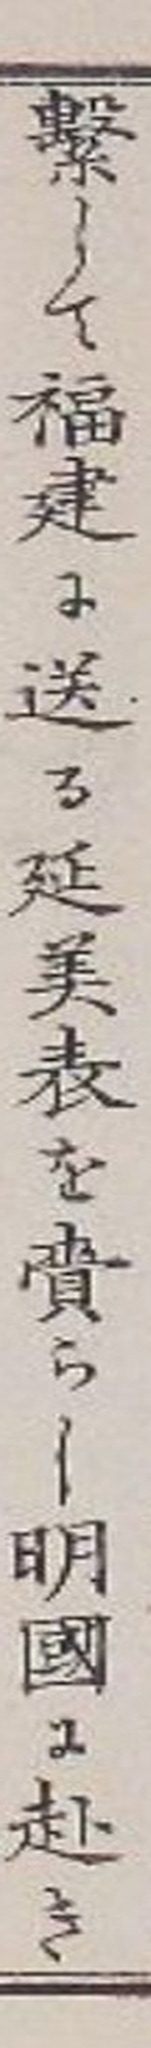繋して福建に送る延美表をらし明国に赴き
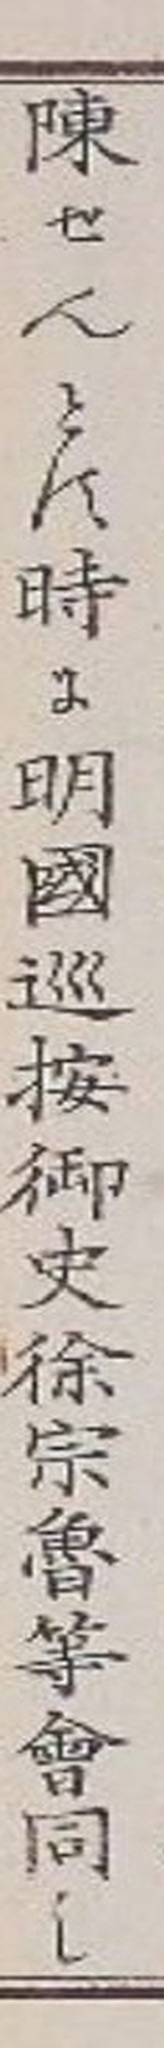陳せんとす時に明国巡按御徐宗魯等会同し
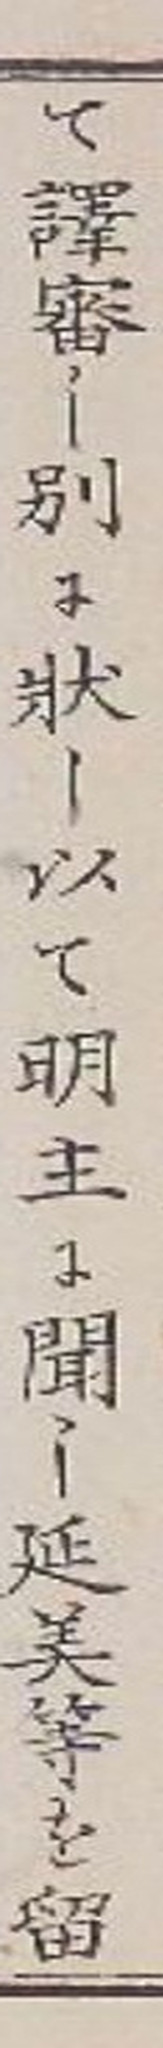て訳審し別に状し以て明主に聞し延美等を留
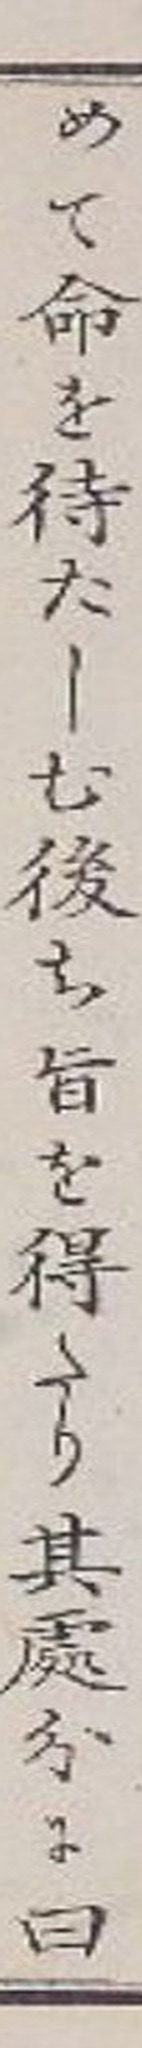めて命を待たしむ後ち旨を得たり其処兮に曰
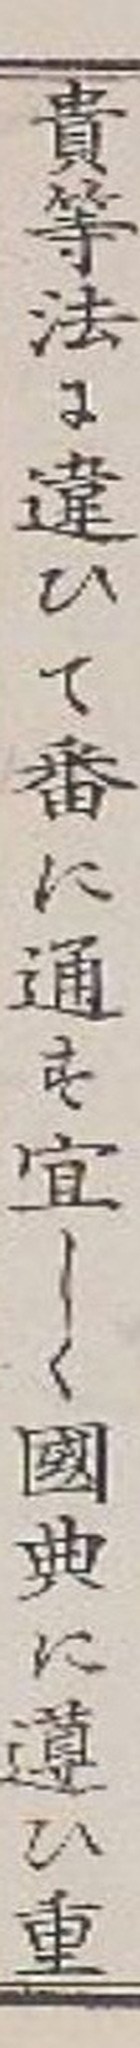貴等法に違ひて番に通す宜しく国典に遵ひ重
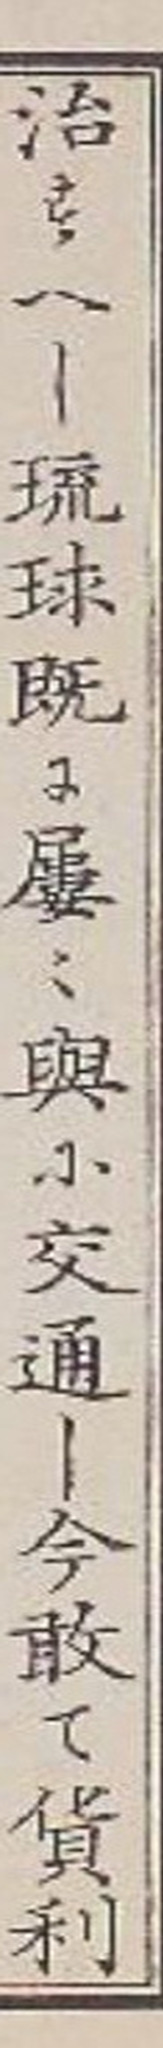治すべし琉球既に屡々与に交通し今敢て貨利
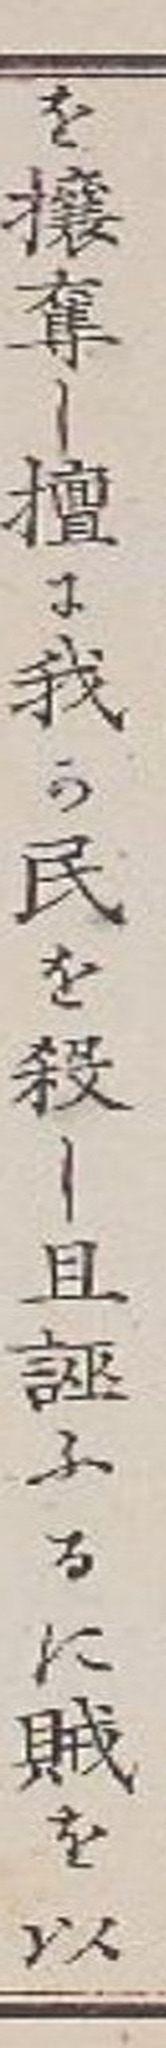を攘奪し檀に我が民を殺し且誣ふるに賊を以
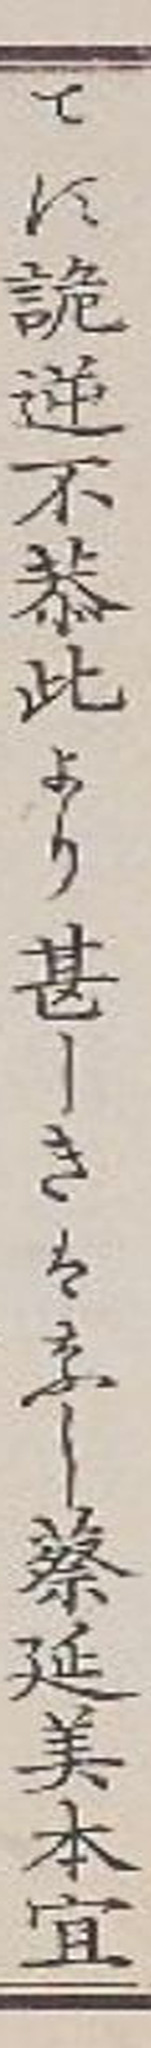てす詭逆不恭此より甚しきはなし蔡延美本宜
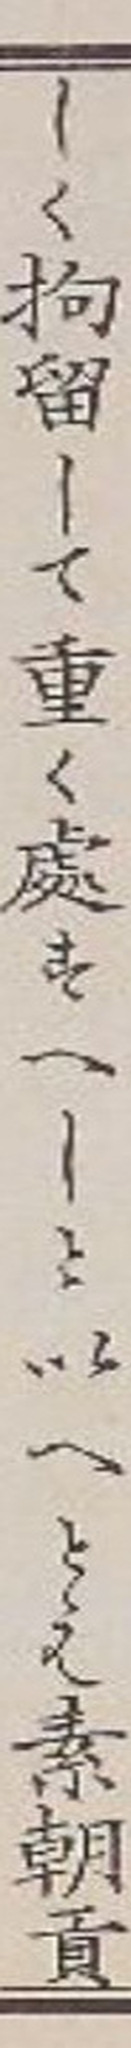しく拘留して重く処すべしといへとも素朝貢
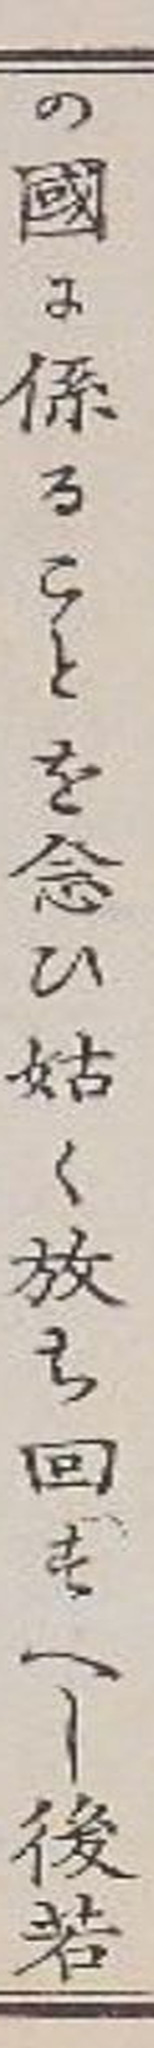の国に係ることを念ひ姑く放ち回すべし後若
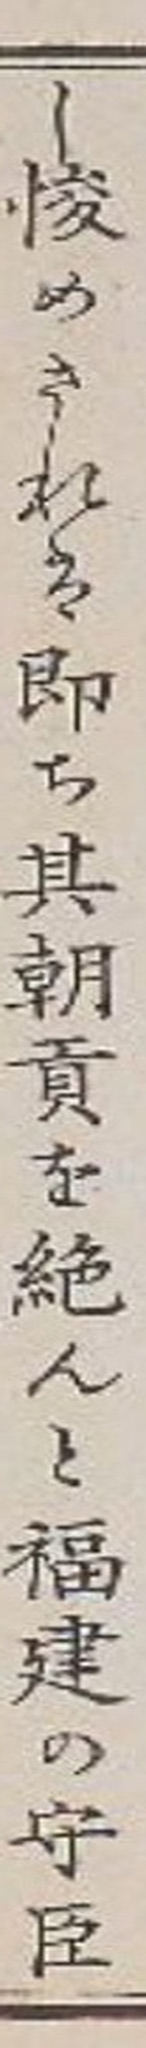し悛めされば即ち其朝貢を絶んと福建の守臣
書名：南島紀事 中
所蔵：University of the Ryukyus Library
